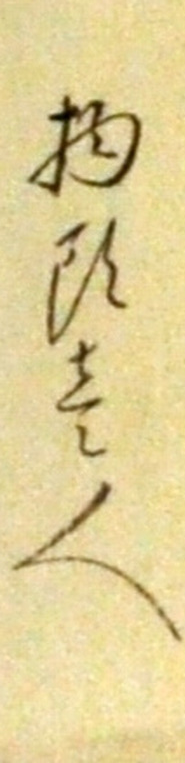小頭壱人
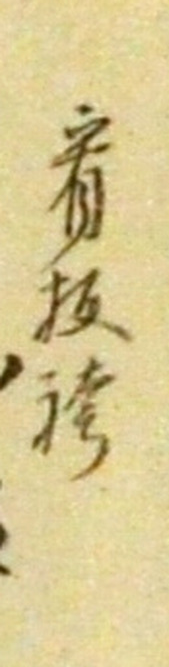看板袴
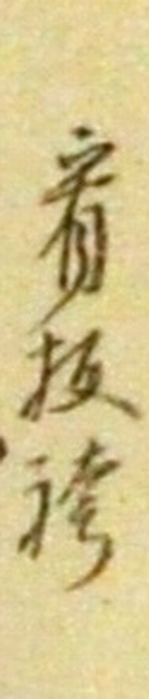看板袴
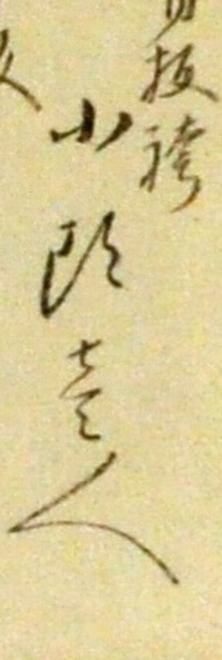小頭壱人
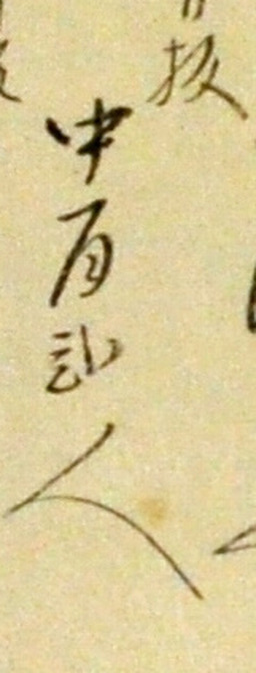中間弐人
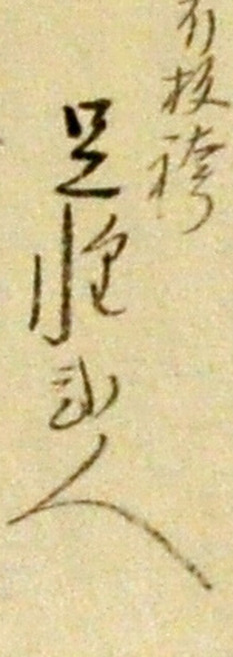足軽弐人
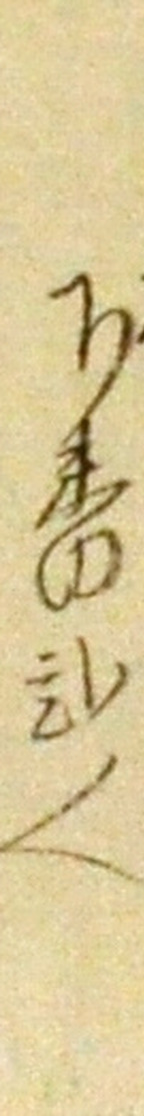下番弐人
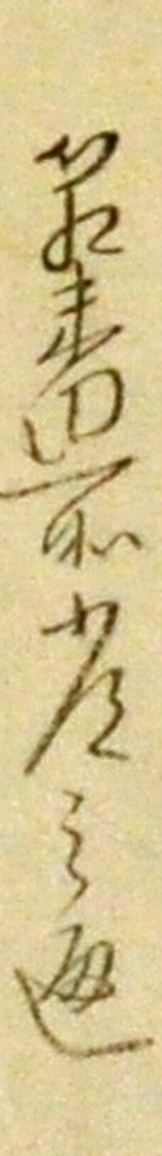箱番所常之通
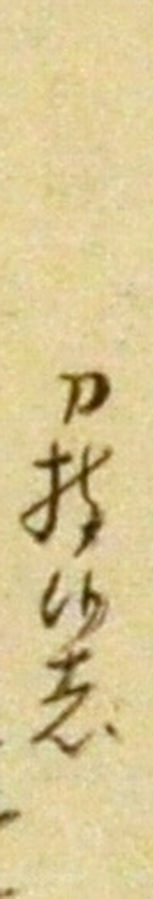刀持候者
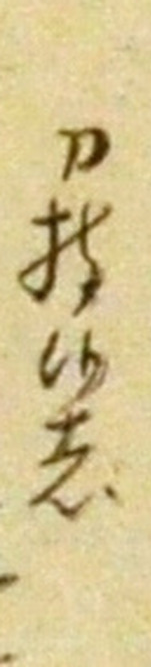刀持候者
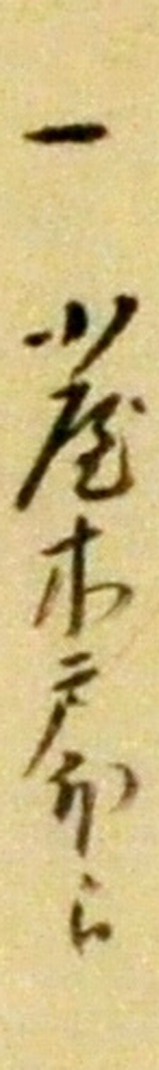一小屋木戸外え
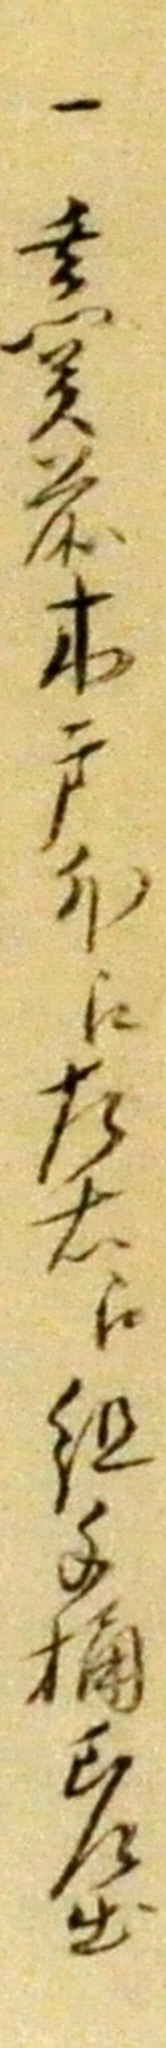一其関前木戸外え左右え組手桶差出
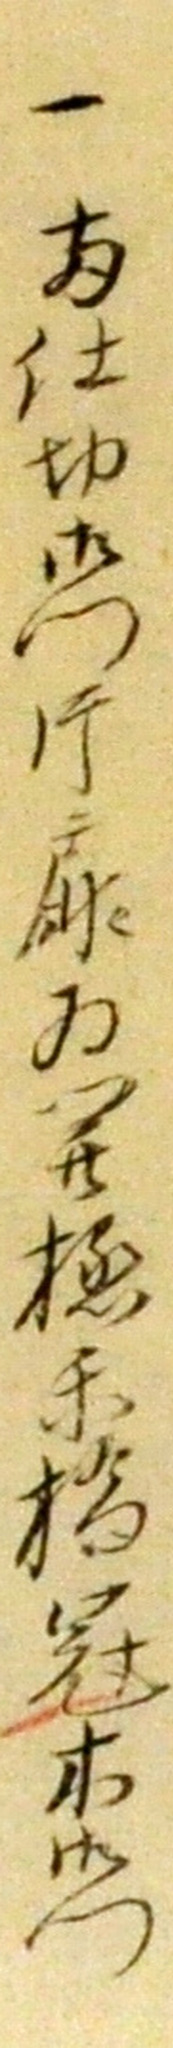一両仕切御門片扉為開極楽橋冠木御門
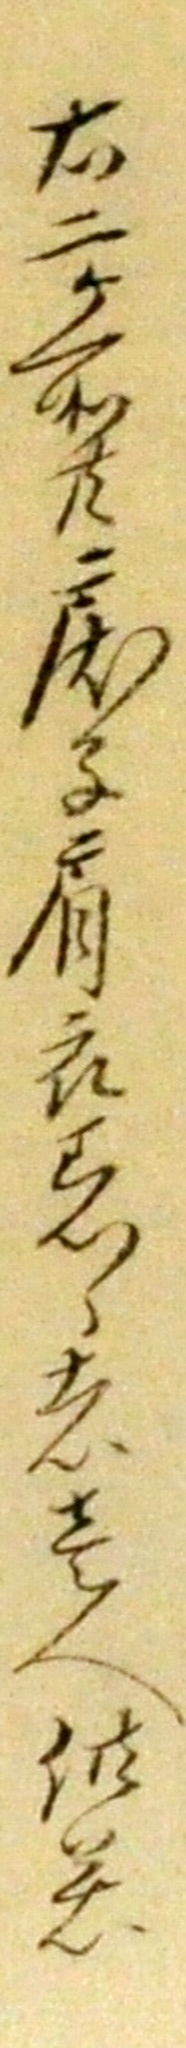右二ヶ所共戻子肩衣着候者壱人供若
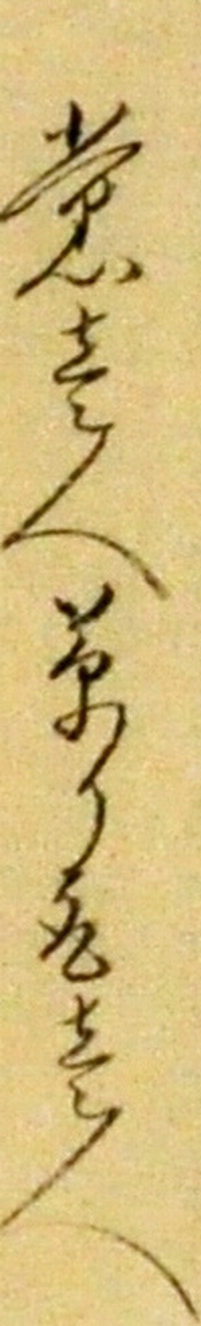党壱人草り取壱人
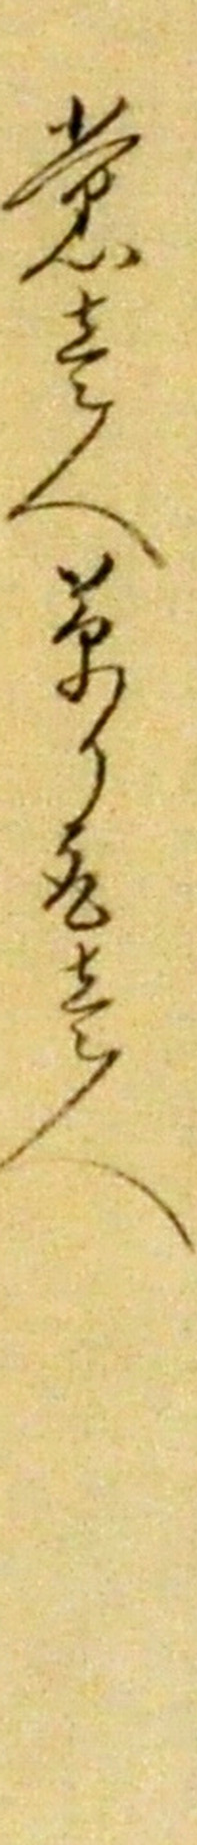党壱人草り取壱人
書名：大阪加番関係諸書留〔一括〕
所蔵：伊那市立高遠町図書館・合同会社AMANE
